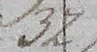32
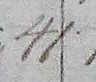41
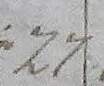27
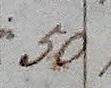50
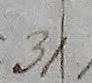31
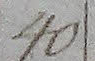40
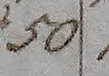50
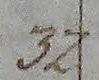32
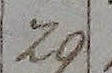29
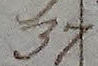37
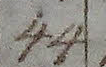44
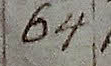64
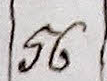56
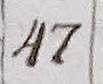47
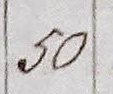50
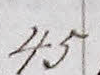45
